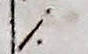1.
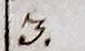3.
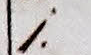1.
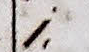1.
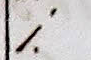1.
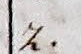2.
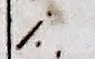1.
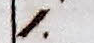1.
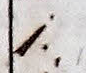1.
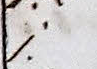1.
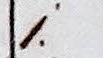1.
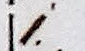1.
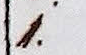1.
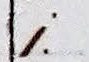1.
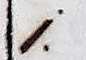1.
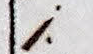1.
